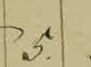5.
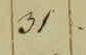31
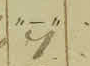7.
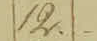12.
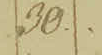30.
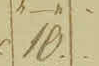10.
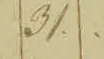31.
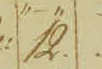12.
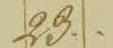23.
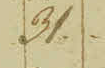31.
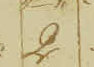2.
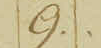9.
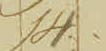14.
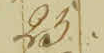25
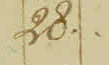28.
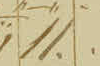11.
